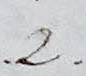2
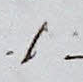1
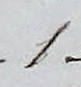1
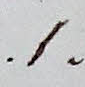1
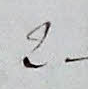2
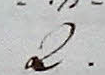2
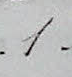1
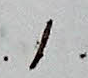1
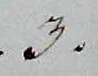3
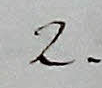2
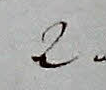2
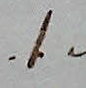1
